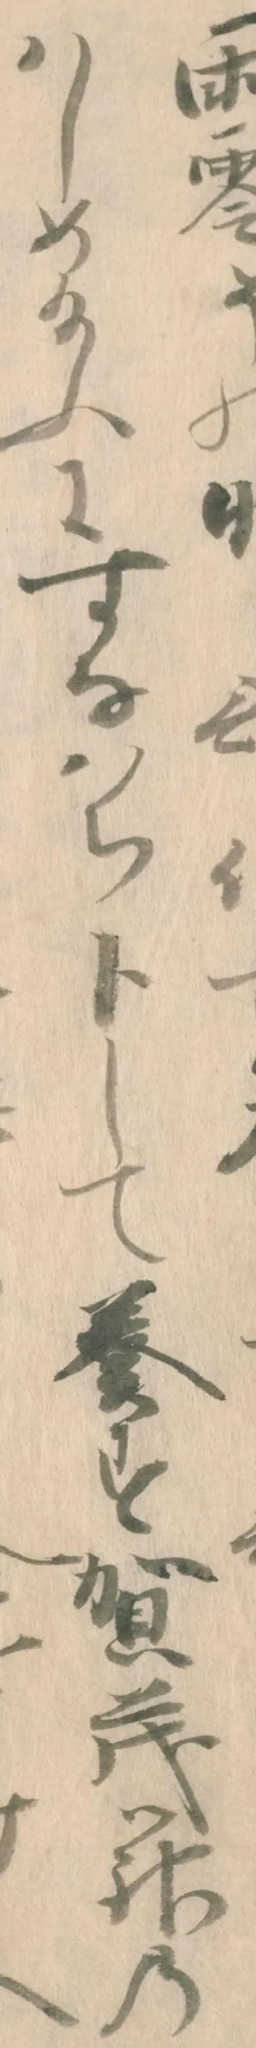はしめ給ふにすなはち卜して奏す賀茂御神の
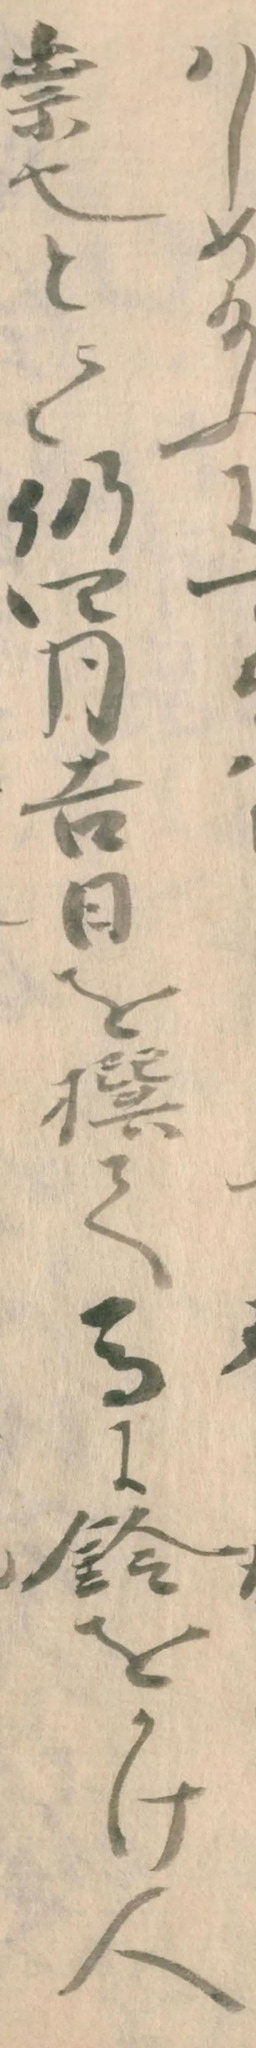祟也と云々仍四月吉日を撰て馬に鈴をかけ人
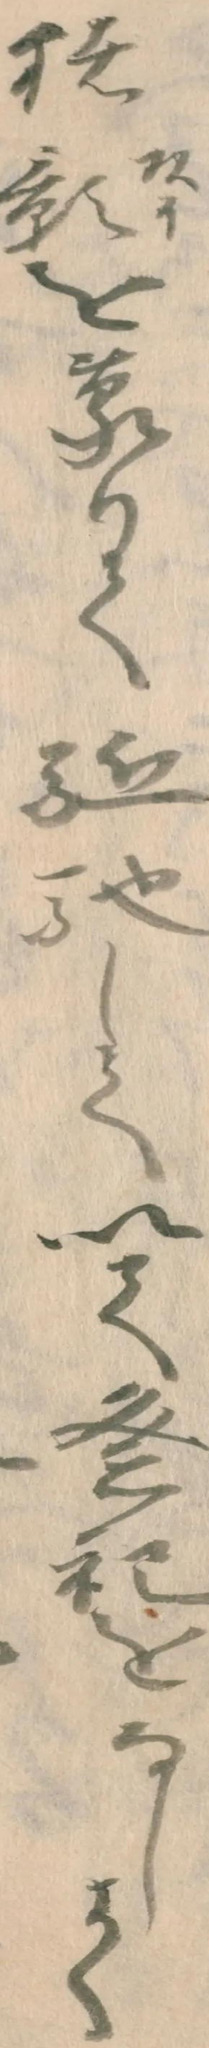猪影を蒙りて駈馳して以て祭祀をなして
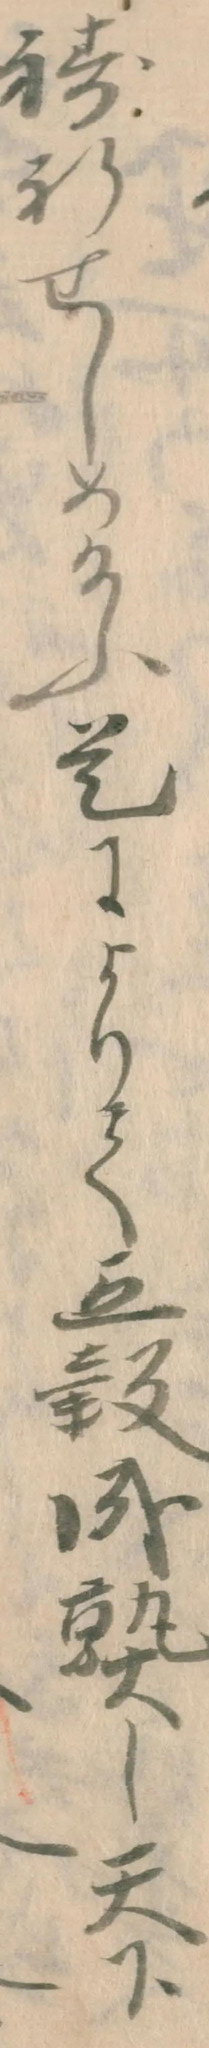祷祈せしめ給ふ是によりて五穀成熟し天下
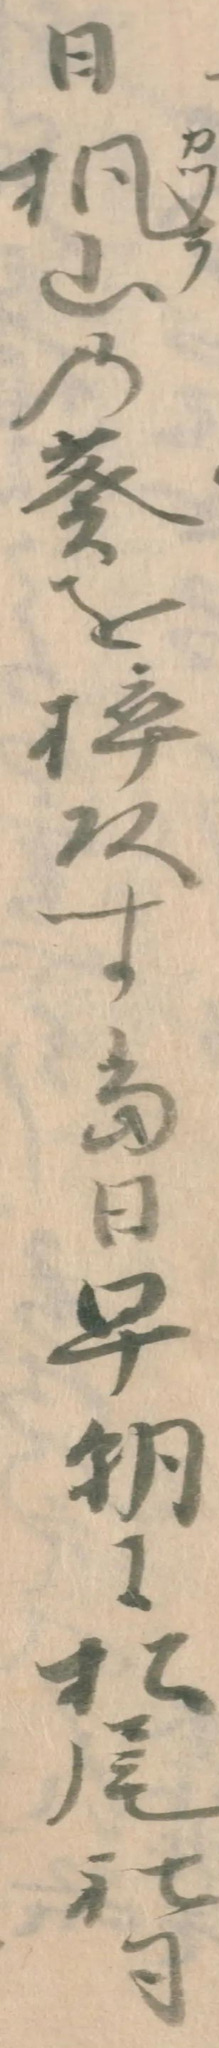日楓山の葵を捽頭す当日早朝に松尾社司
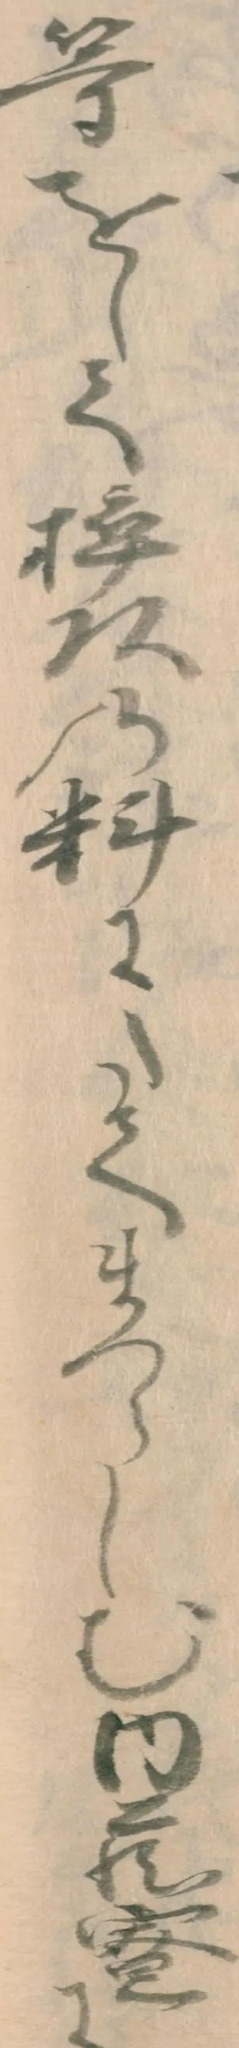等をして捽頭の料にたてまつらしむ内蔵寮に
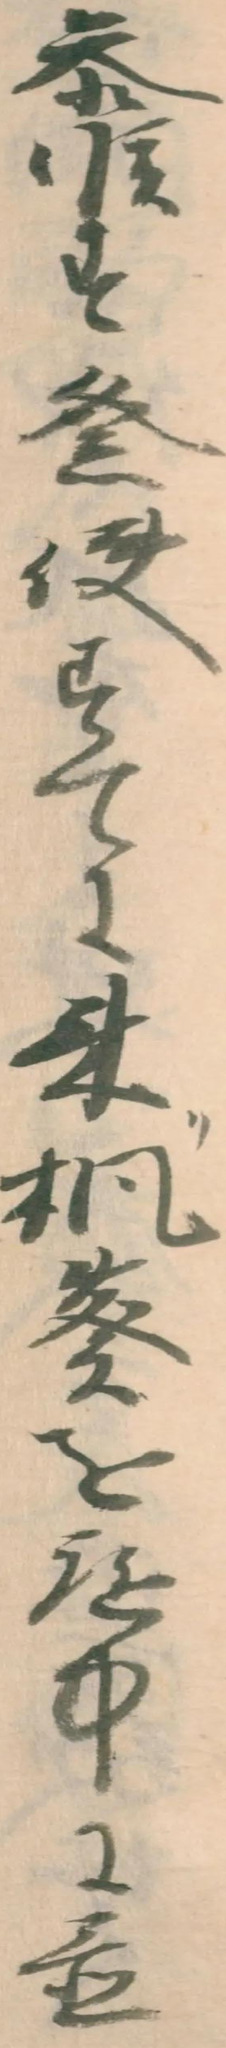参候す祭使すてに来楓葵を庭中に置
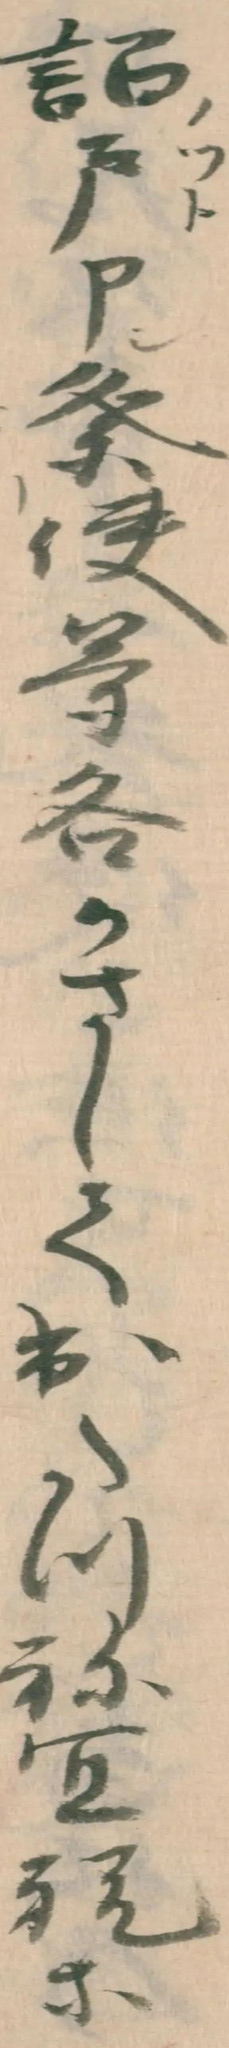詔戸申祭-使等各かさして出たつ祢宜祝等
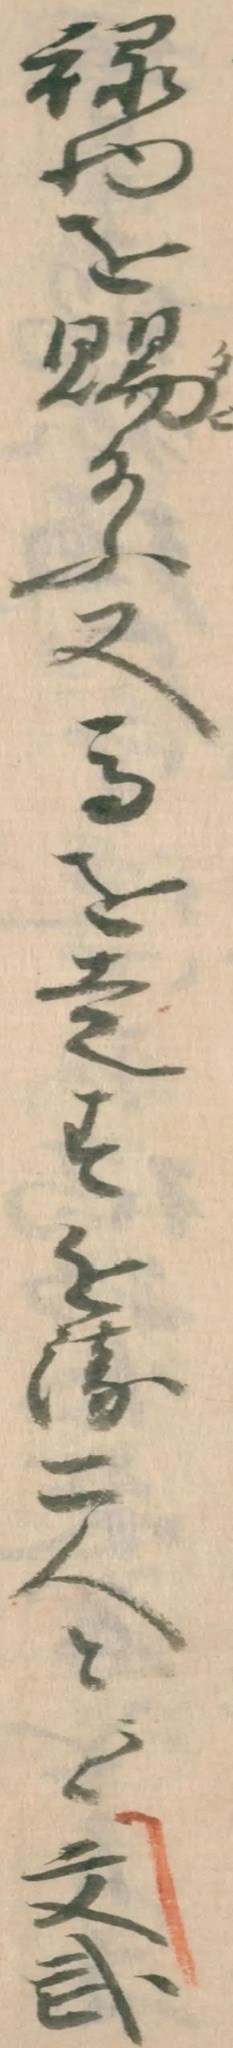禄物を賜給ふ又馬を走す近衛二人と云々文武
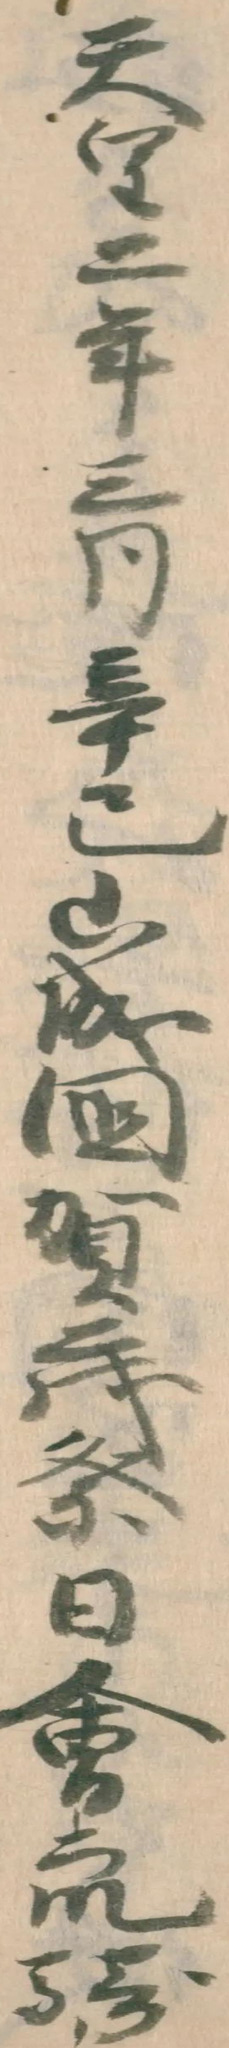天皇二年三月辛巳山城国賀茂祭日会-衆騎-
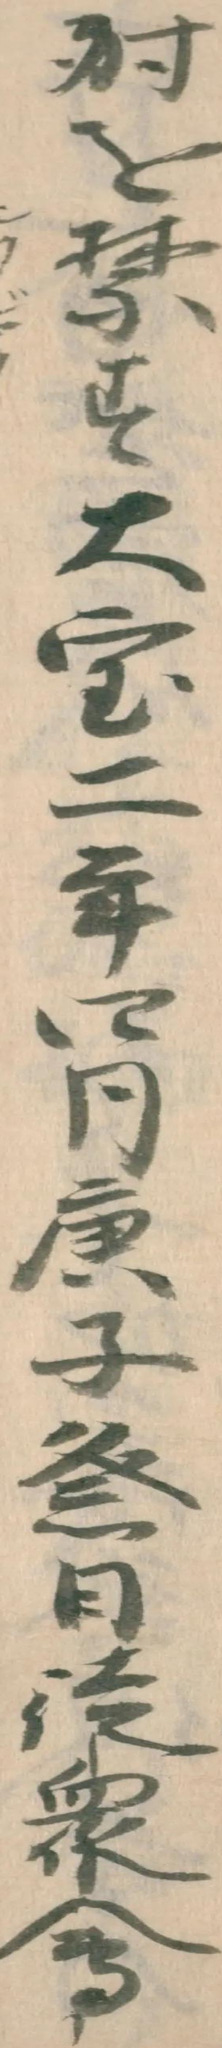射を禁す大宝二年四月庚子祭日徒-衆会-
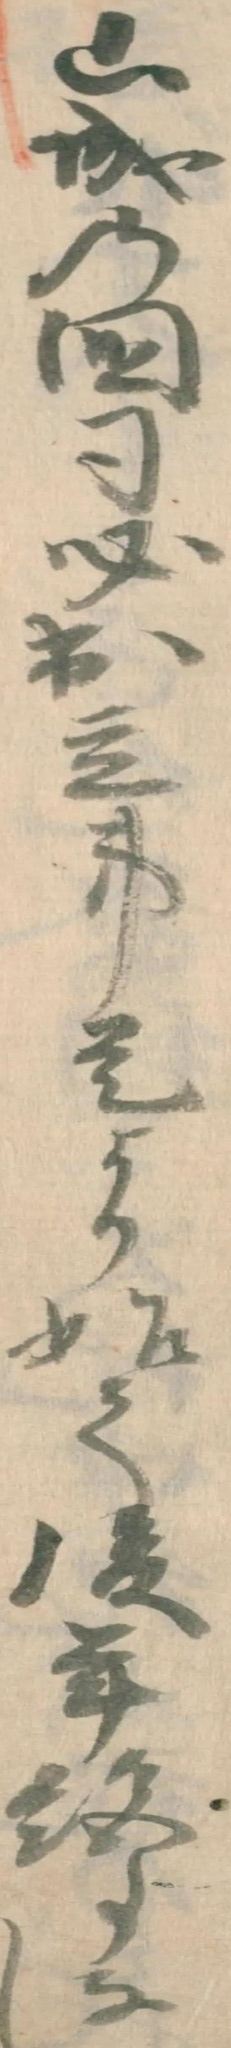山城の国司必出立事是より始て後年絶事なし
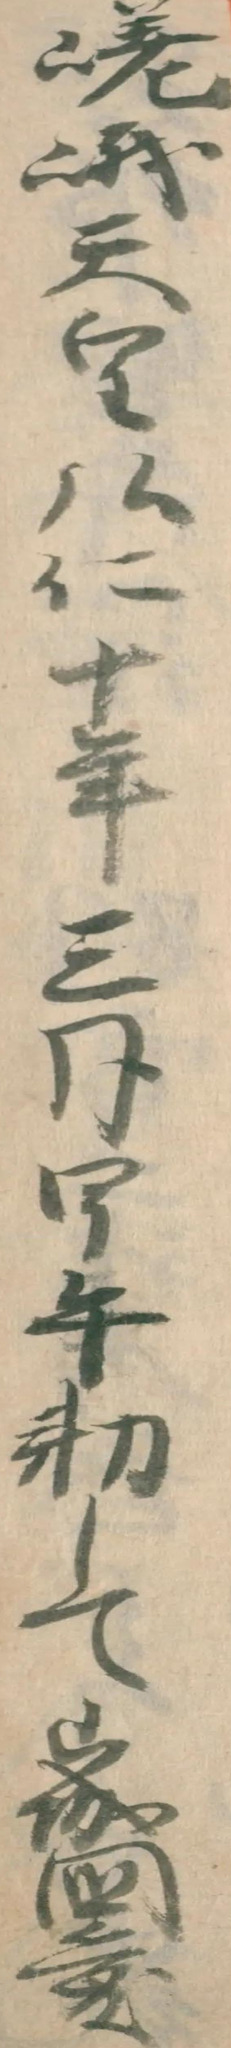嵯峨天皇弘仁十年三月四甲午勅して山城国愛

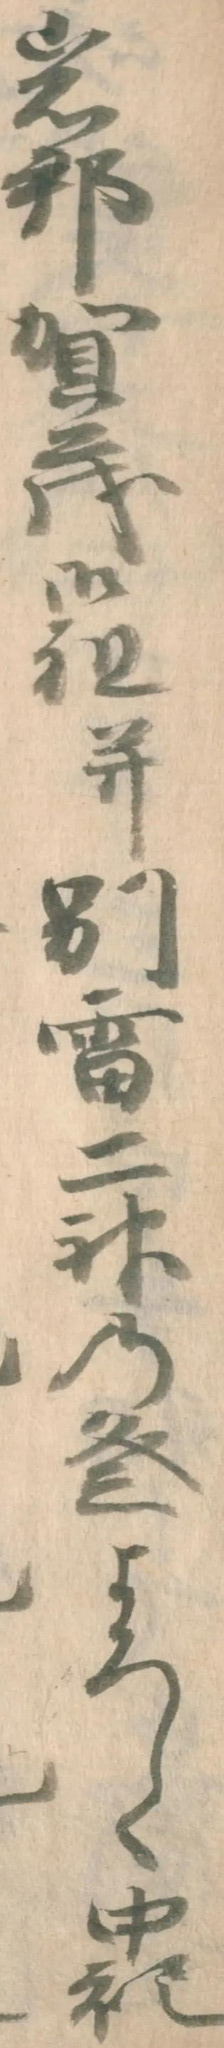岩邦賀茂御祖并別雷二神の祭よろしく中祀
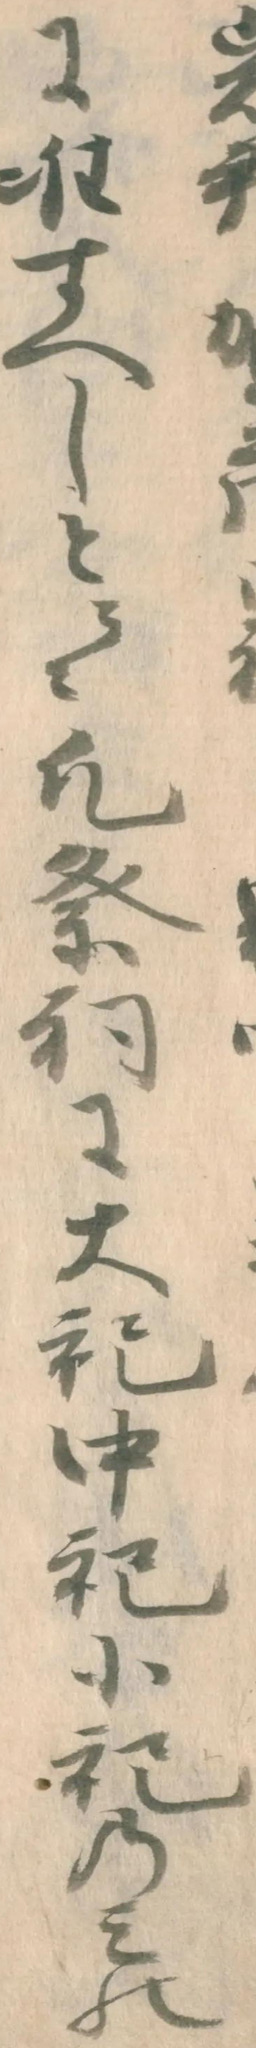に准すへしと云々凡祭祠に大祀中祀小祀の三の
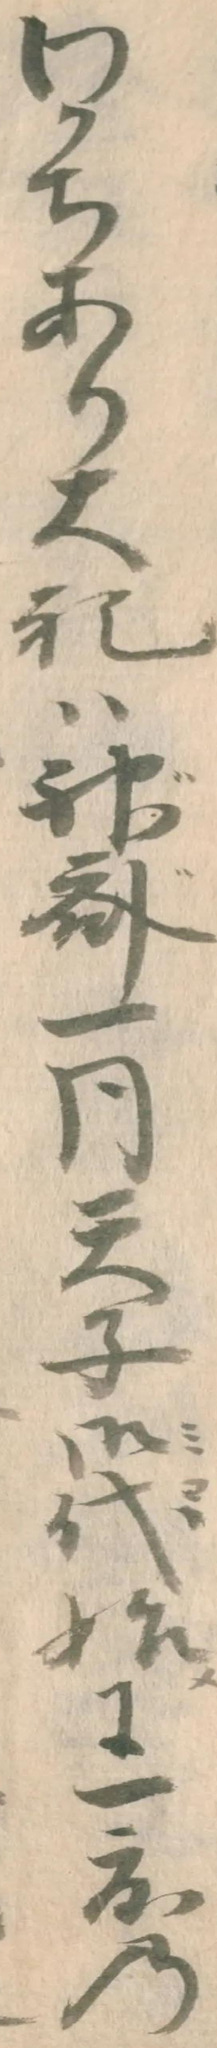わかちあり大祀は神斎一月天子御代始一度の
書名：賀茂社記録. 第1冊
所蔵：国立国会図書館 National Diet Library, JAPAN
